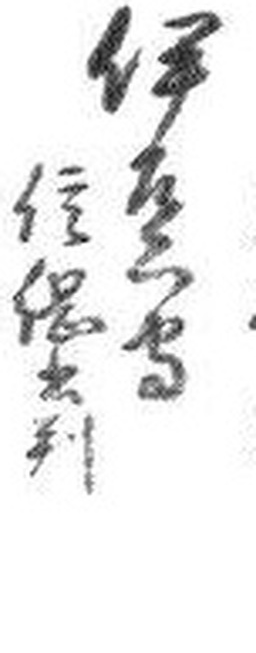信綱書判
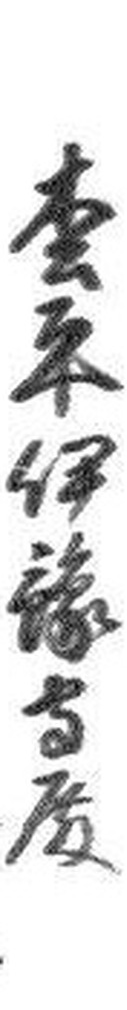松平伊豫守殿
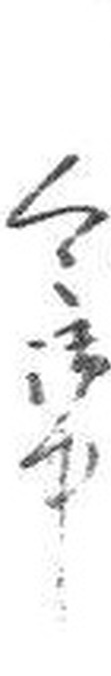人々御中

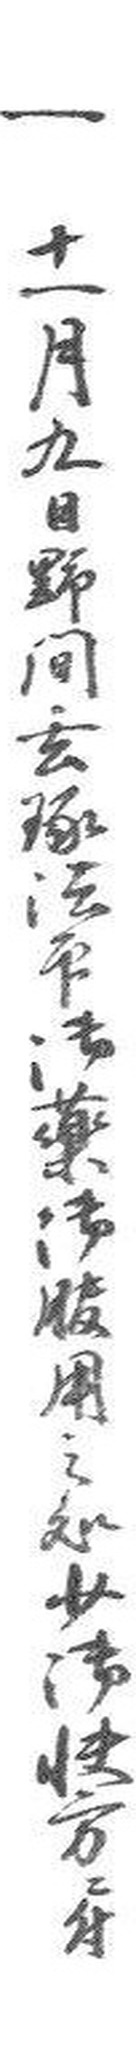一十一月九日野間玄琢法印御薬御服用之処少御快方ニ付
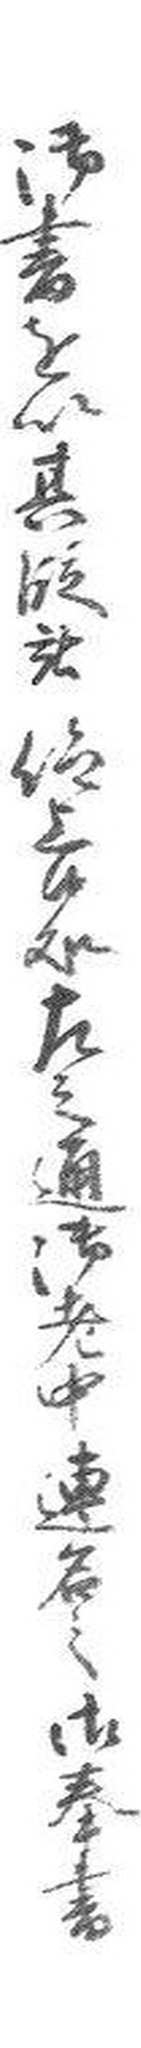御書を以其段被仰上候処左之通御老中連名之御奉書
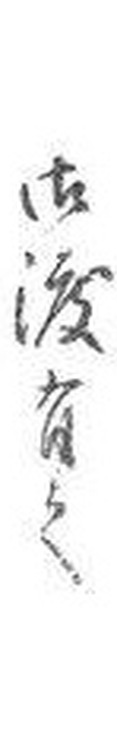御渡有之
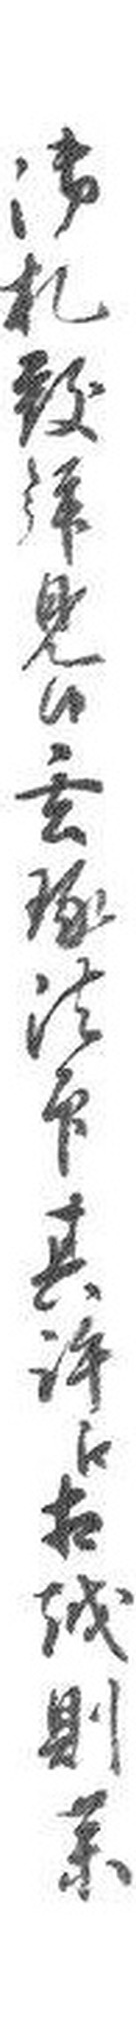御札致拝見候玄琢法印其許江相越則薬
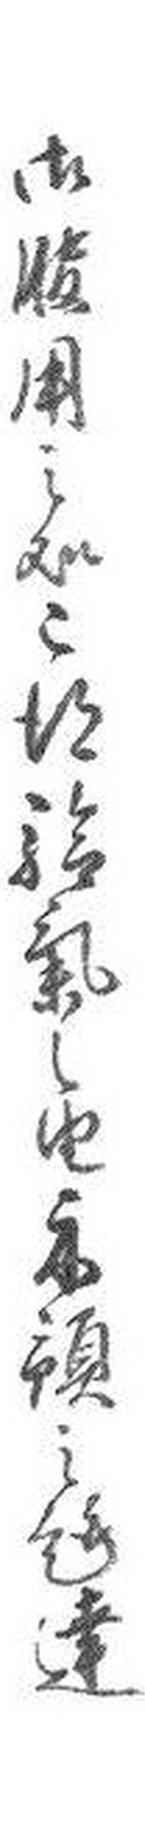御服用之処被得験気候由示預之趣達
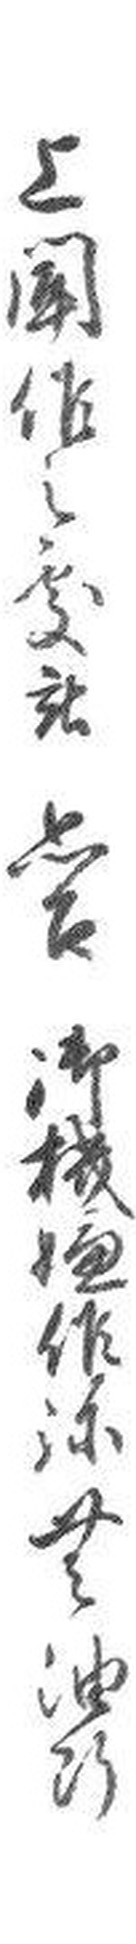上聞候之処被思召御機嫌候弥無油断
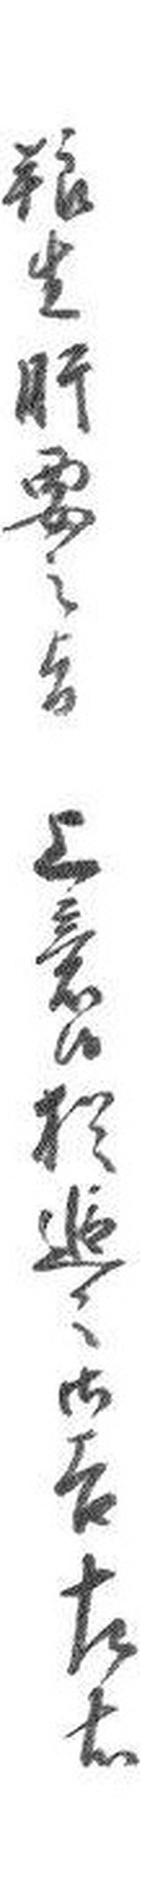養生肝要之旨上意候猶追々御吉左右
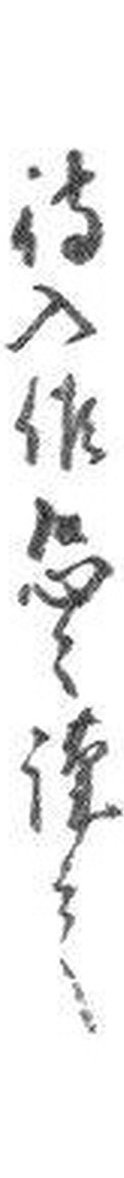待入候恐々謹言
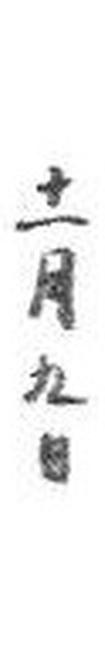十一月九日
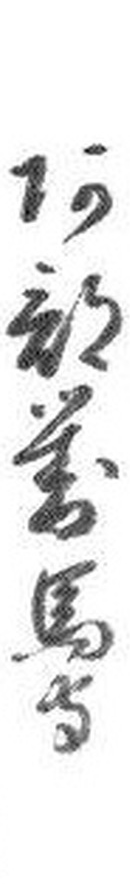阿部対馬守
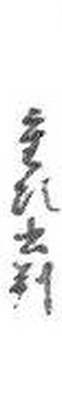重次書判
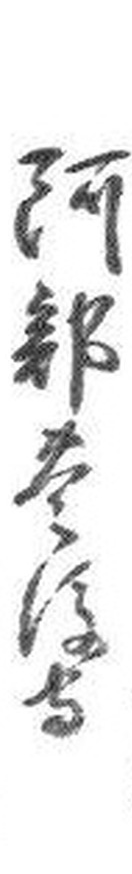阿部豊後守
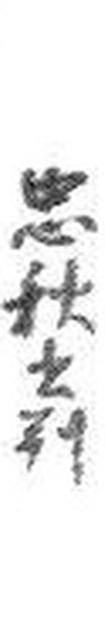忠秋書判
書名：家譜 四 忠昌公 従寛永七年到正保四年
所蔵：福井県文書館 Fukui Prefectural Archives
